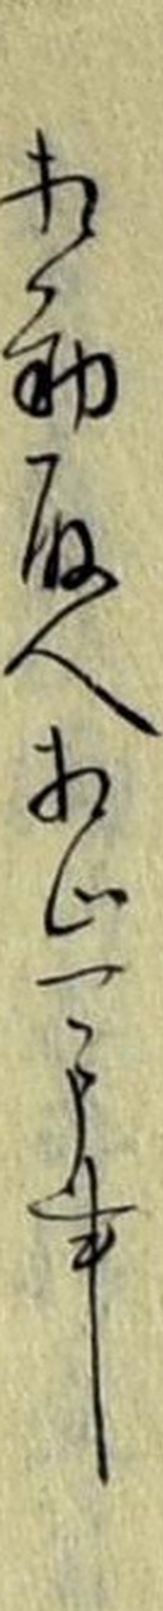相勤取人相止可申事
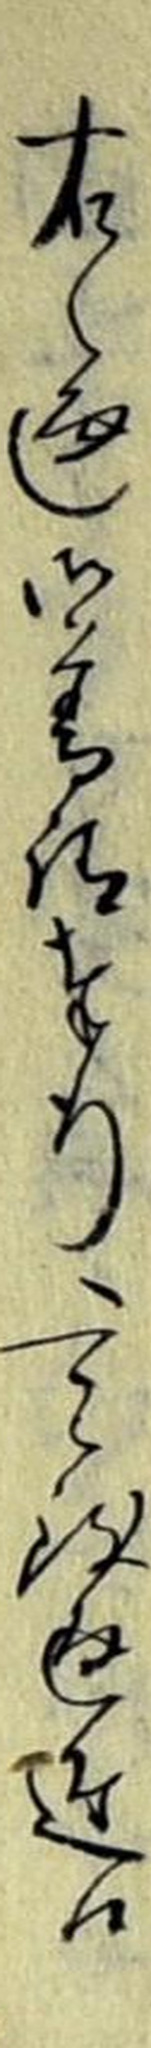右之通御普請奉行へ可致通達候

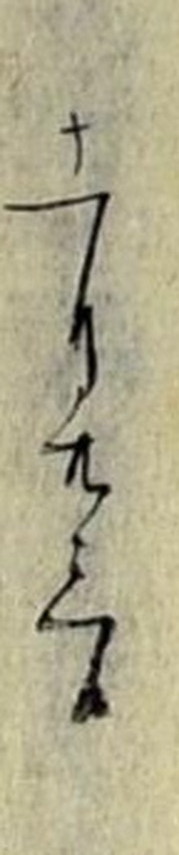十一月廿三日
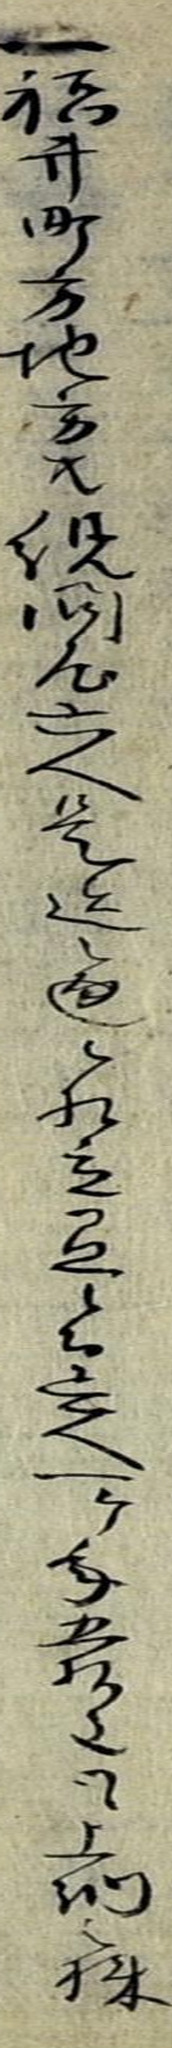一福井町方地方共繭問屋六人是迄之通被相立置候而壱人一ヶ年五拾匁つヽ上納之株
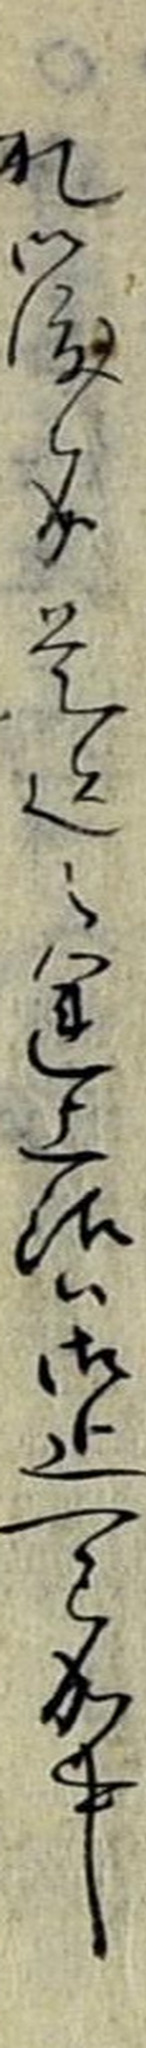札御渡被成是迄之運上金は御止可被成事
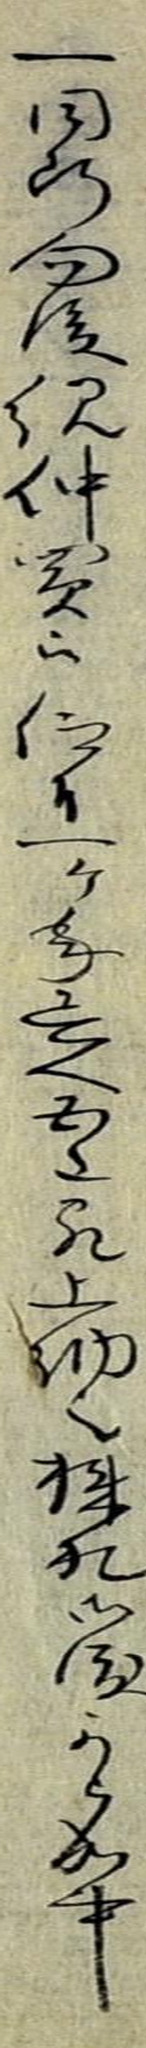一同断向後繭仲買被仰付一ヶ年壱人五匁宛上納之株札御渡可被成事
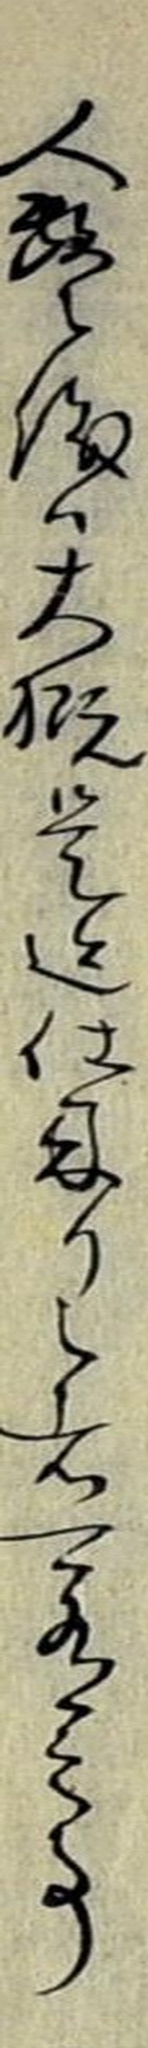人数之儀は大概是迄仕来り之者可有之事
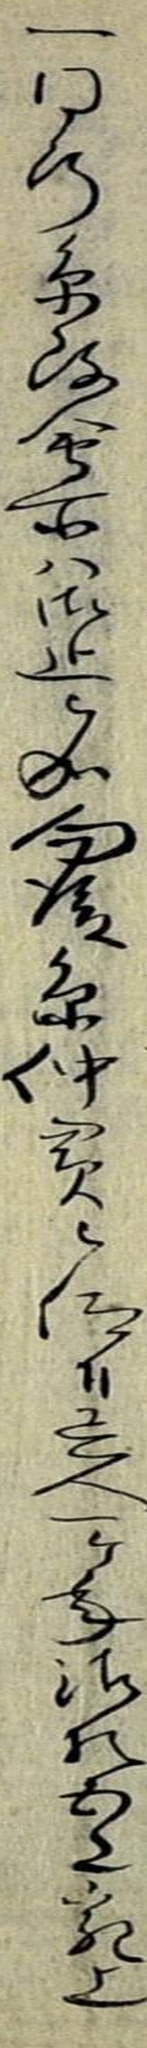一同断糸改会所は御止被成向後糸仲買被仰付壱人一ヶ年銀拾五匁宛上
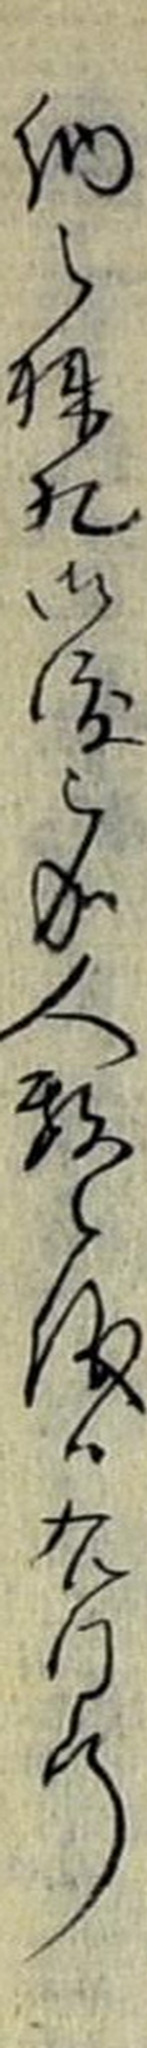納之株札御渡被成人数之儀は右同断
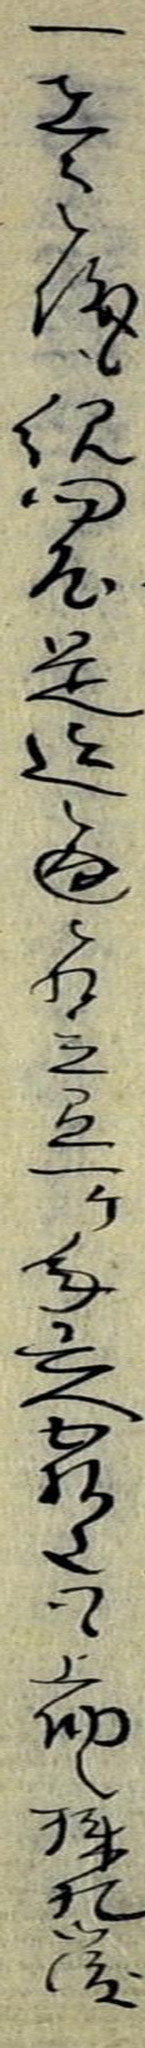一在々之儀も繭問屋是迄之通被相立置一ヶ年壱人五拾匁つヽ上納之株札御渡
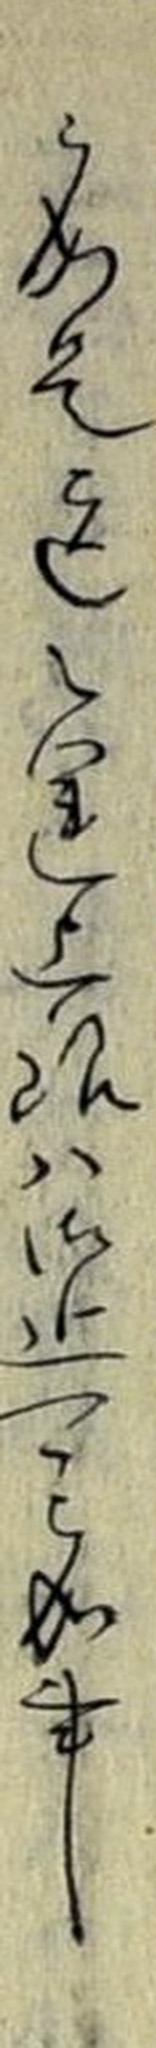被成是迄之運上銀は御止可被成事
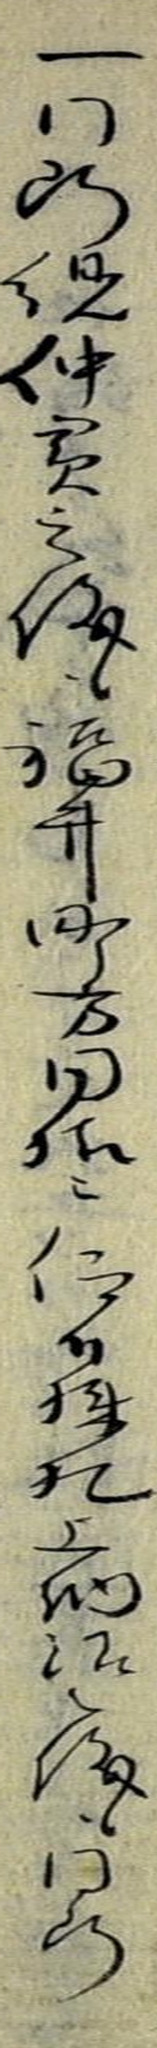一同断繭仲買之儀も福井町方同様被仰付株札上納銀之儀も同断
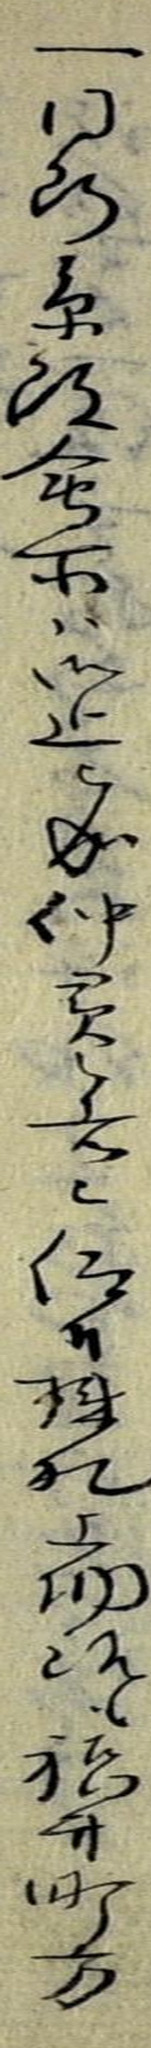一同断糸改会所は御止被成仲買之者被仰付株札上納銀も福井町方
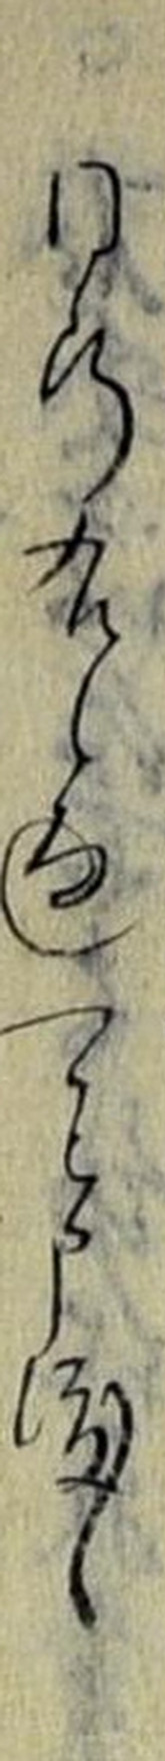同断右之通可被申渡候
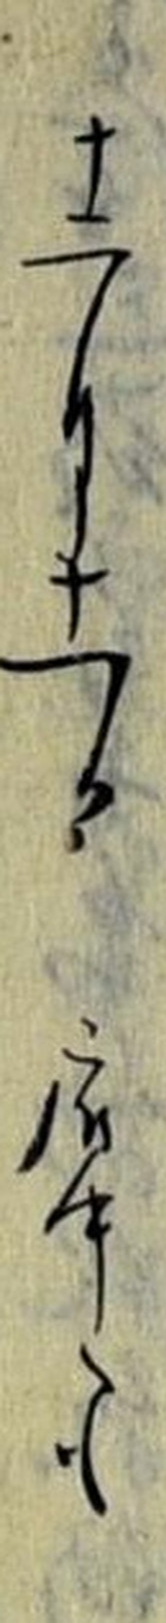十二月十一日府中へも
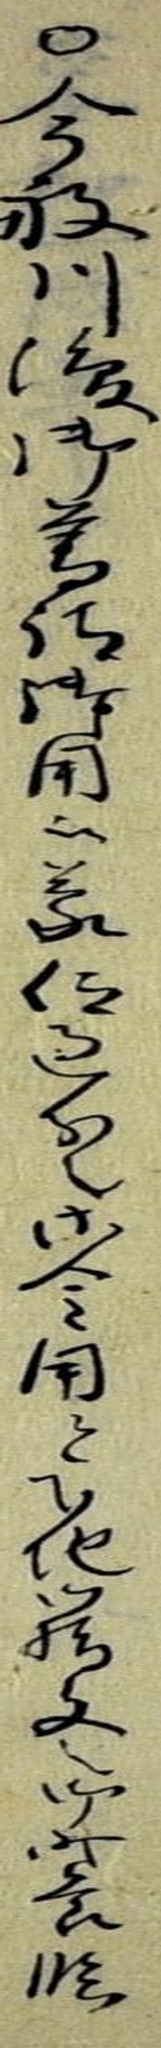一今般川浚御普請御用被蒙仰過分之御金用に候下地御指支之御時節臨
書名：命令之部 四
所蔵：福井県文書館 Fukui Prefectural Archives
